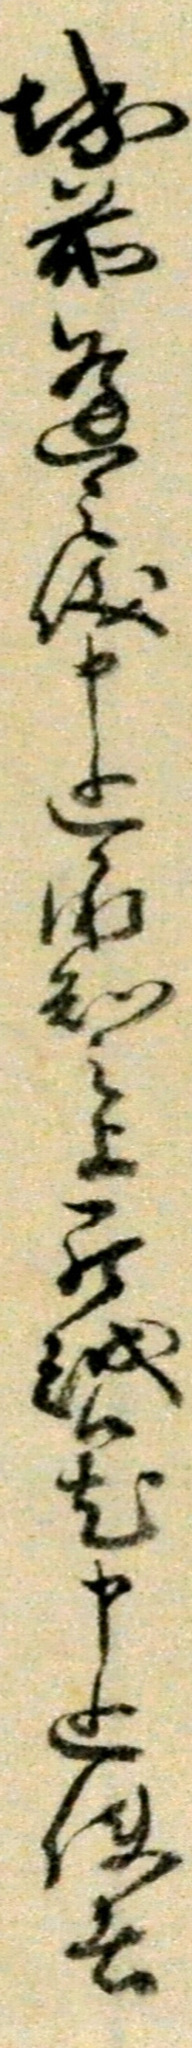城前逢之儀中止承知之上罷越候尤中止使者
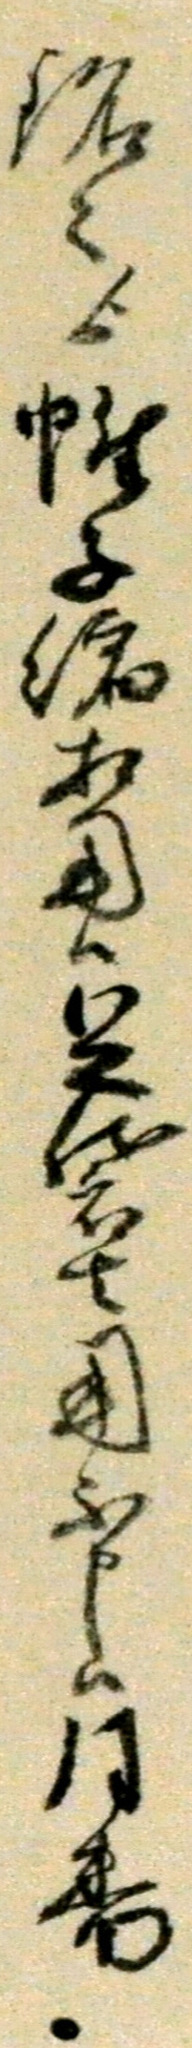銘々ゟ帷子縮相用候足袋者用不申候月番
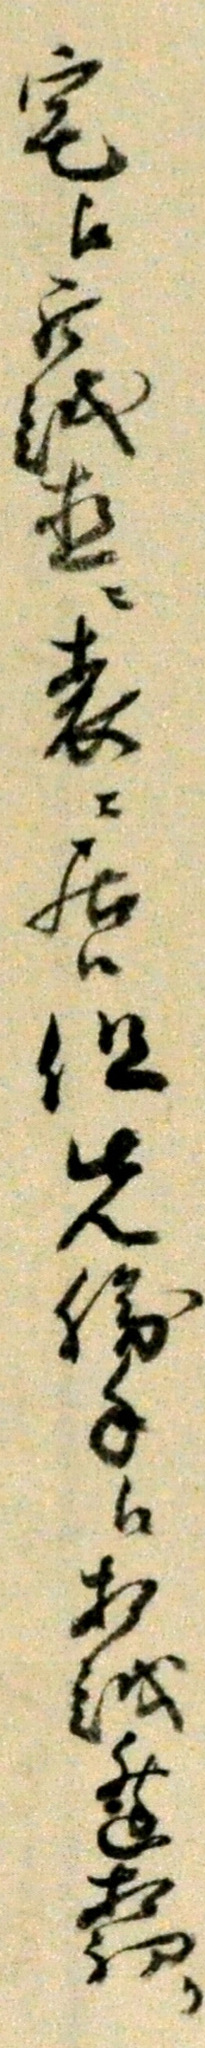宅江罷越直二表ニ居候但先勝手江相越逢相初リ
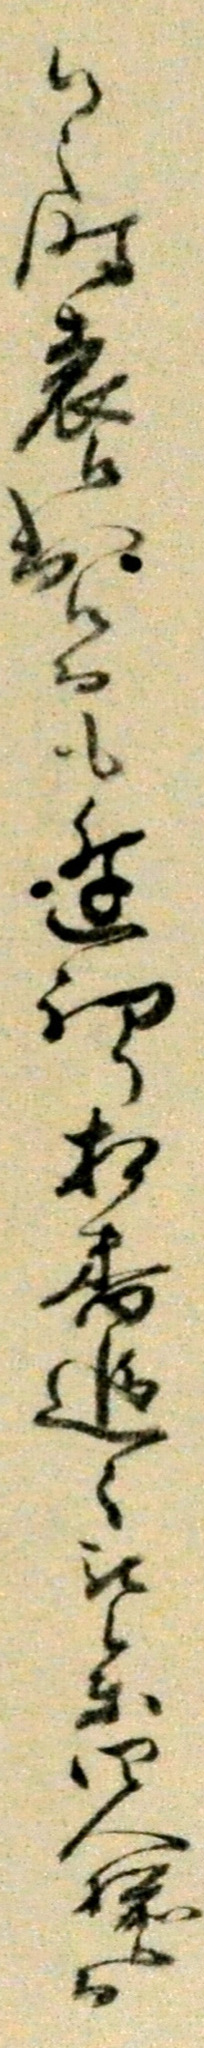候之時表江出候而も逢初リ相番追々被参四人揃候而
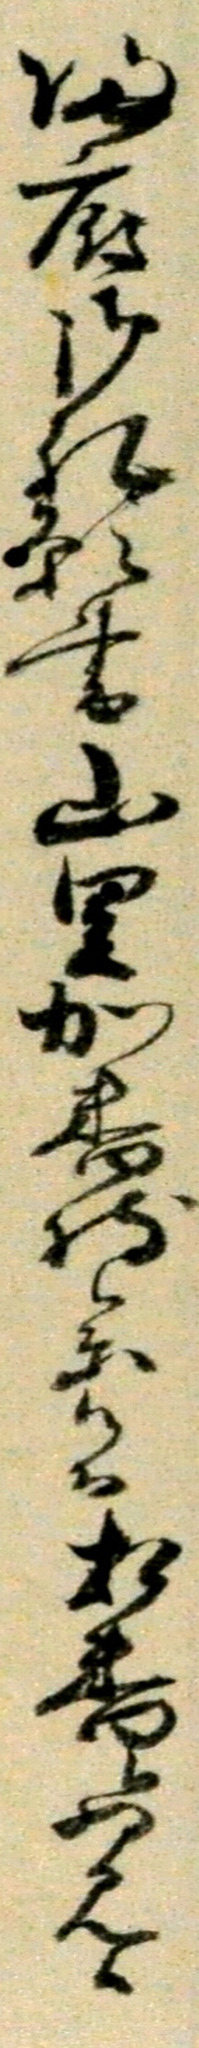帰府御礼願書山里加番持参候而相番江め見候
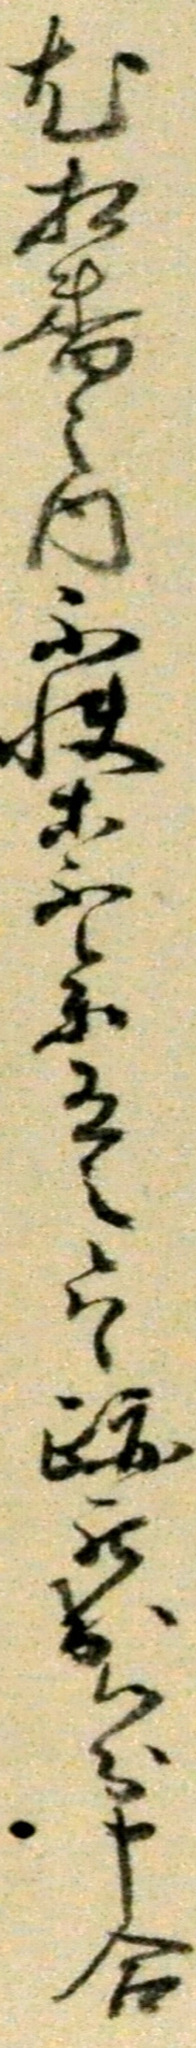尤相番之内不快等不参有之候ハハ跡罷出候分申合
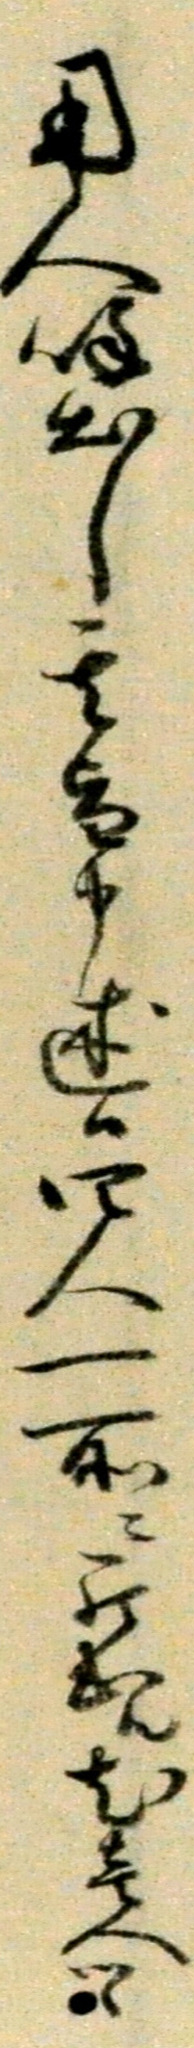用人呼出し其旨申述候四人一所二罷出ㇽ尤壱人ツツ
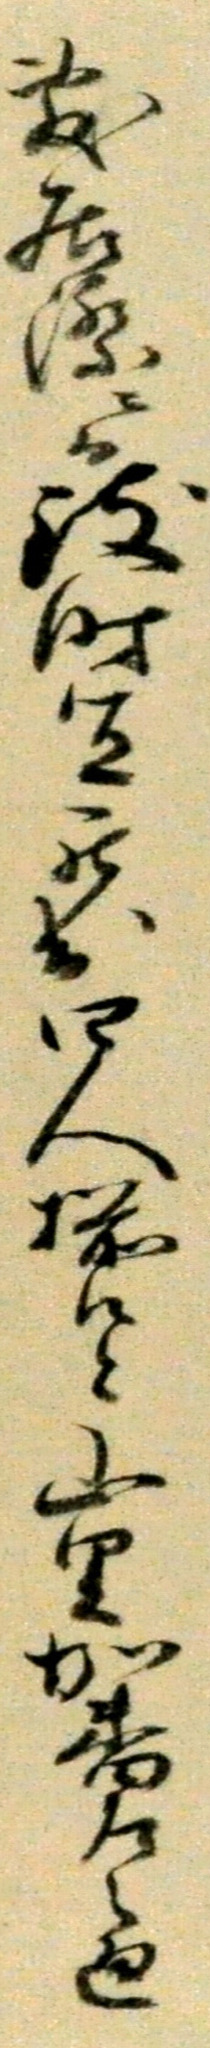敷居際ニ而致時宜罷出四人揃候と山里加番左之通
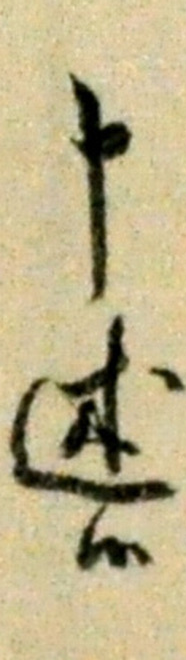申述候
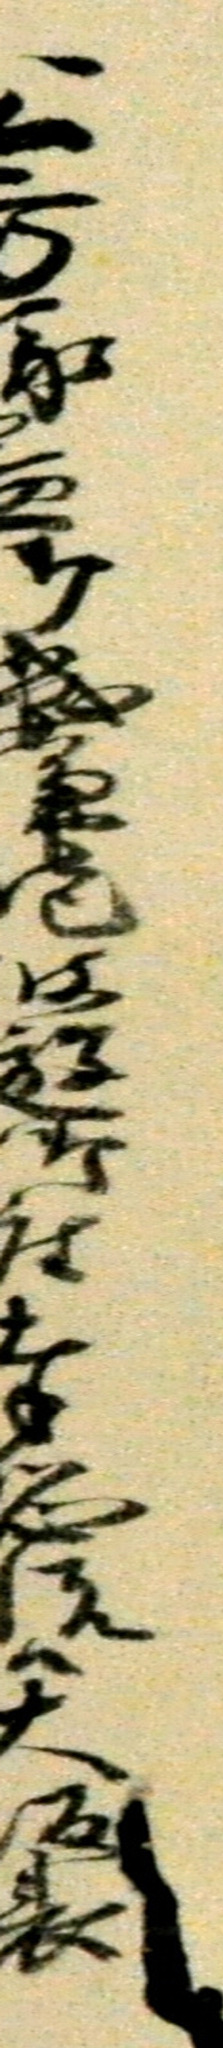公方様益御機嫌能被遊御座奉恐悦候大坂表

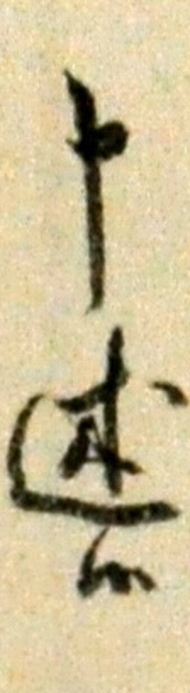申述候
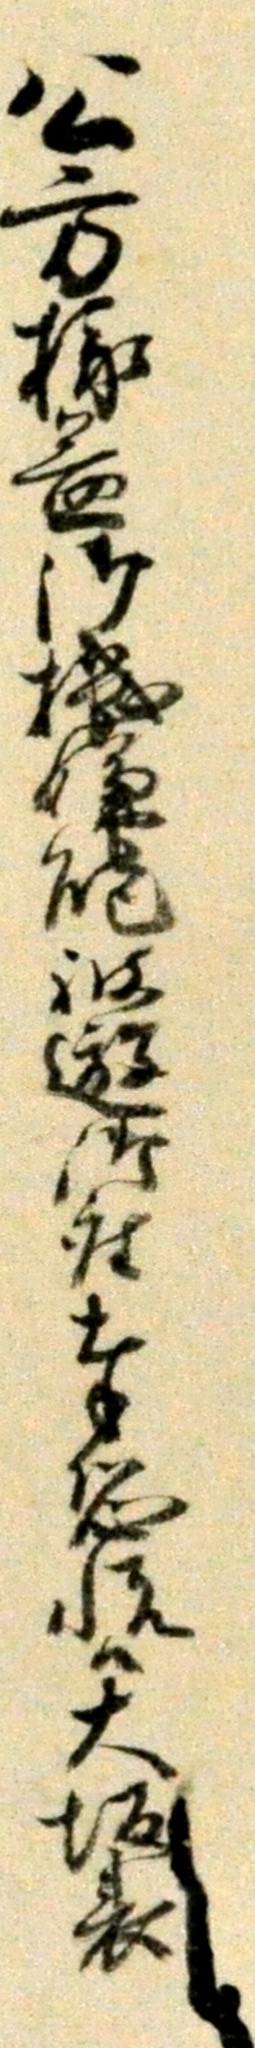公方様益御機嫌能被遊御座奉恐悦候大坂表
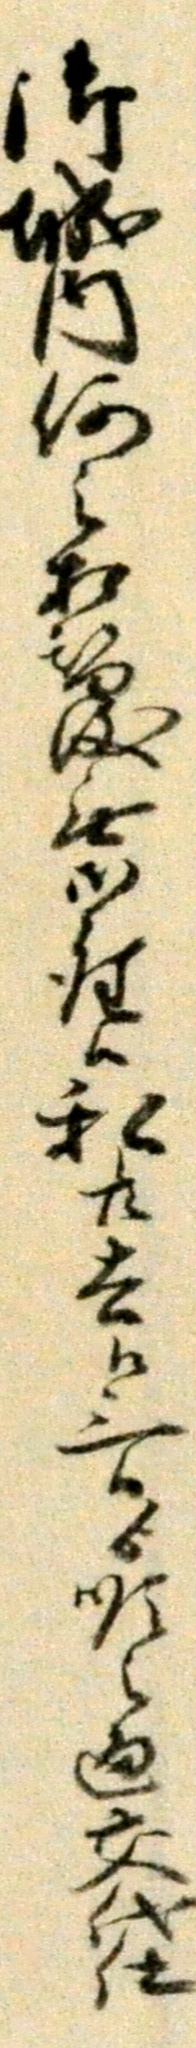御城内何之相知儀無御座候私共去ㇽ三日ゟ順之通交代仕
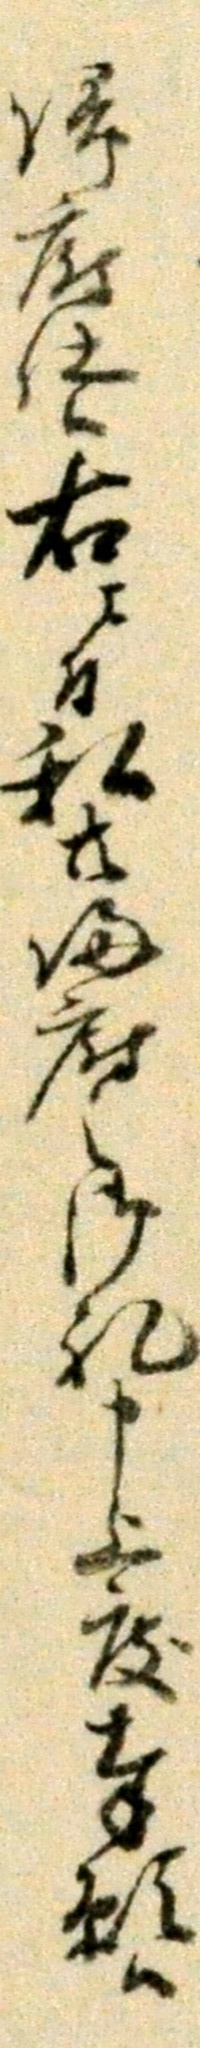帰府仕候右二付私共帰府之御礼申上度奉願候
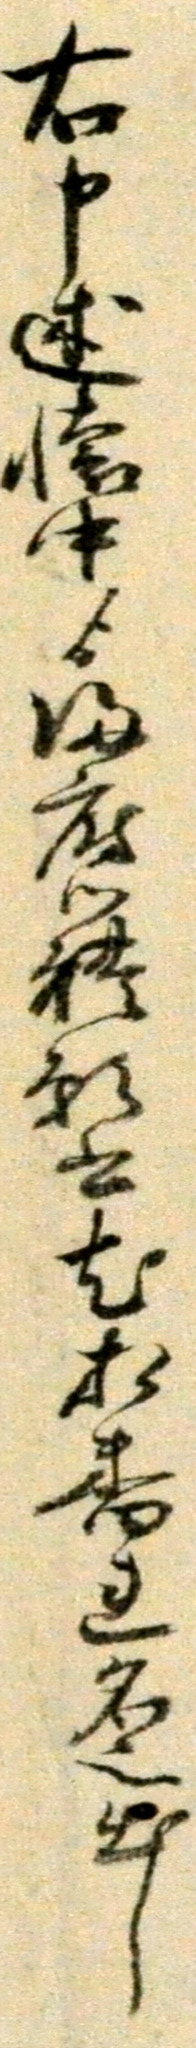右申述懐中ゟ帰府御禮願書尤相番通名之出し
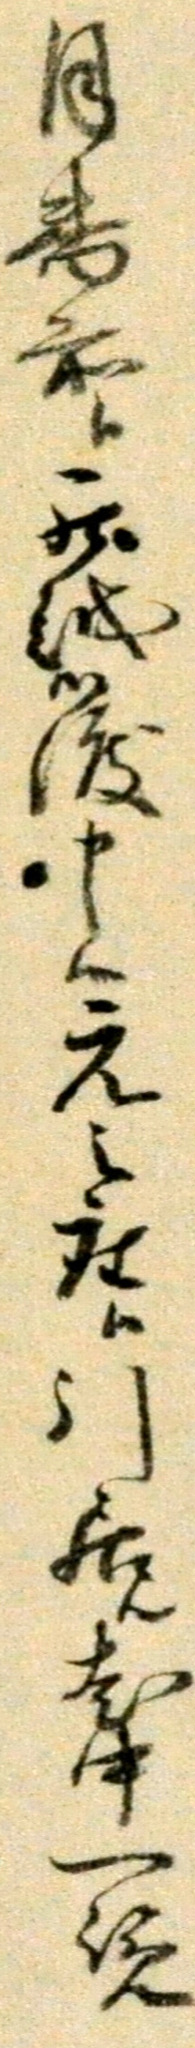月番前江罷越御渡申候元之座江引居ㇽ老中一覧
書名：大阪加番関係諸書留〔一括〕
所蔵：伊那市立高遠町図書館・合同会社AMANE
